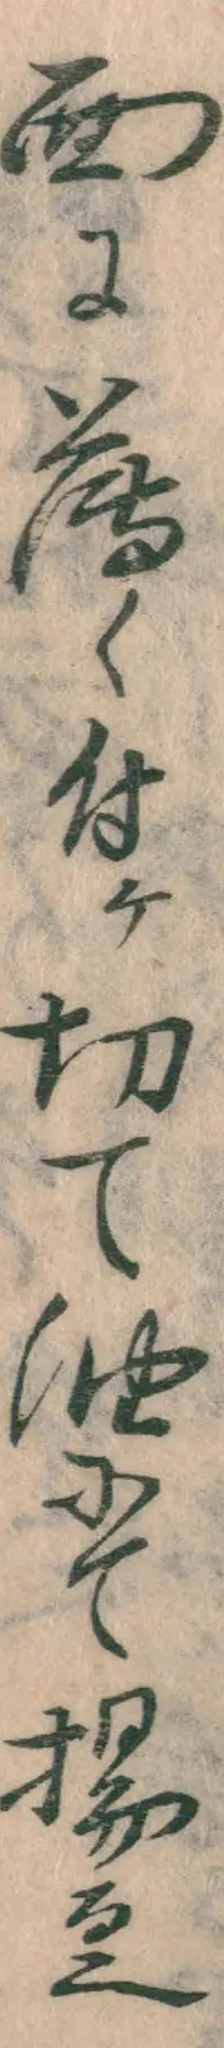面に薄く付け切て油にて揚る也
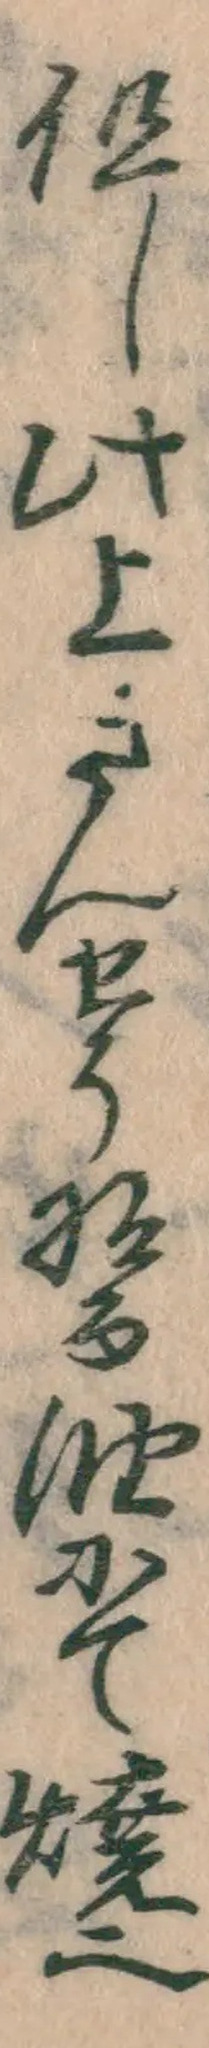但し此上きんせう醤油にて焼也
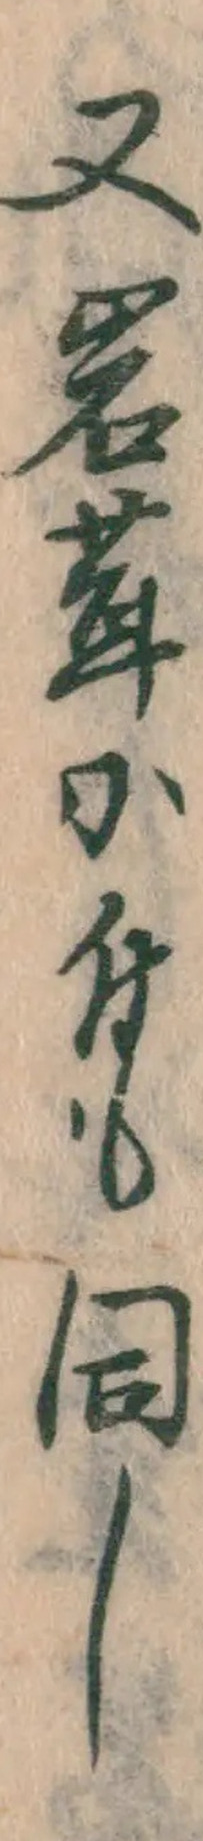又岩茸に付も同し
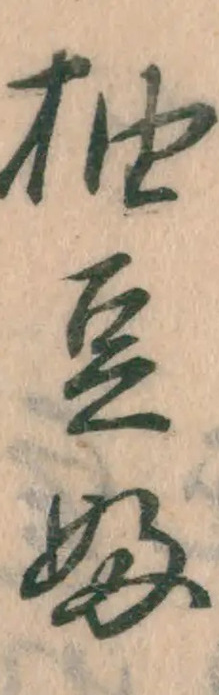柚豆ふ
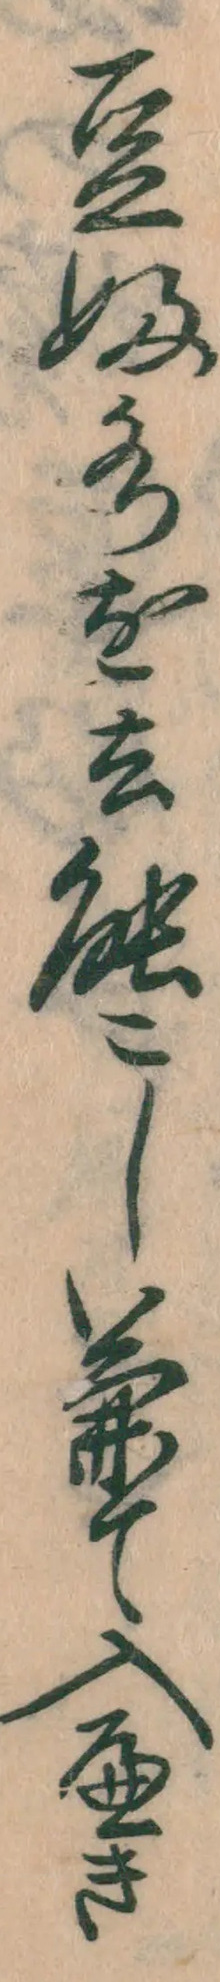豆ふよく水を去能こし兼て入へき
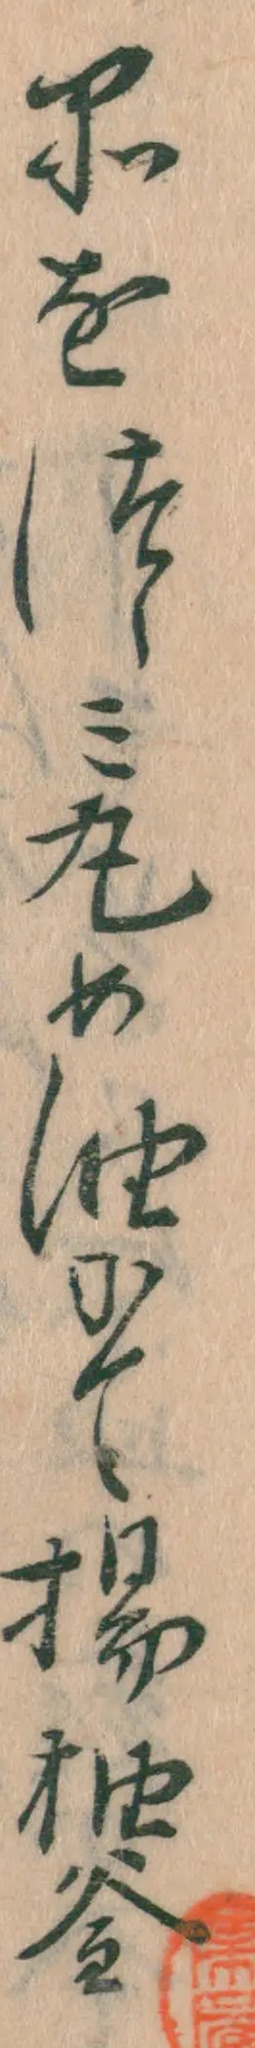品をつゝみ丸め油にて揚柚釜
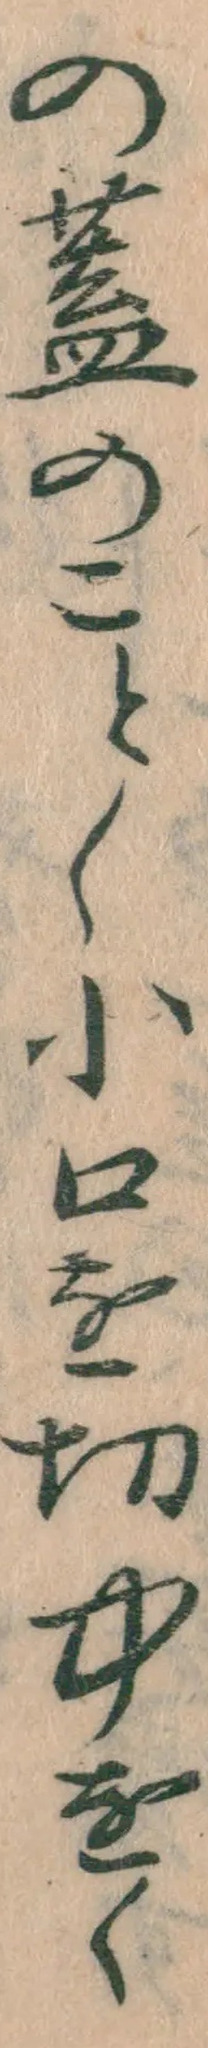の蓋のことく小口を切中をく
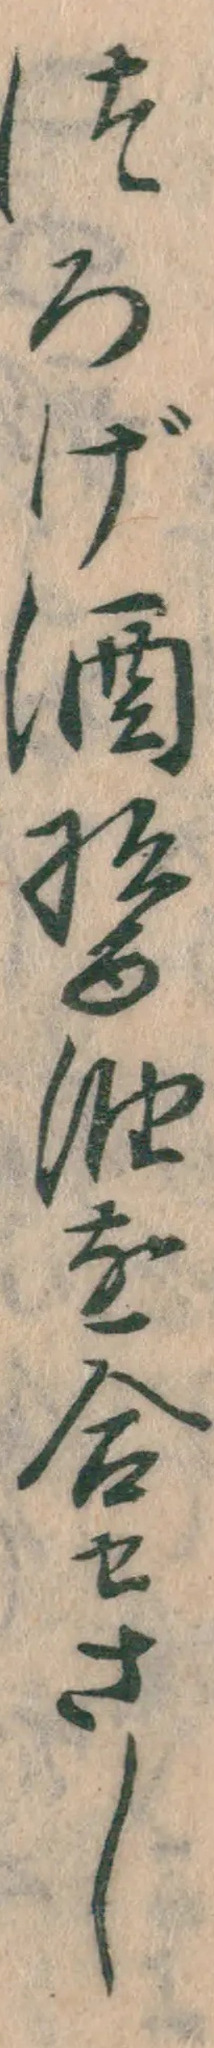つろげ酒醤油を合せさし
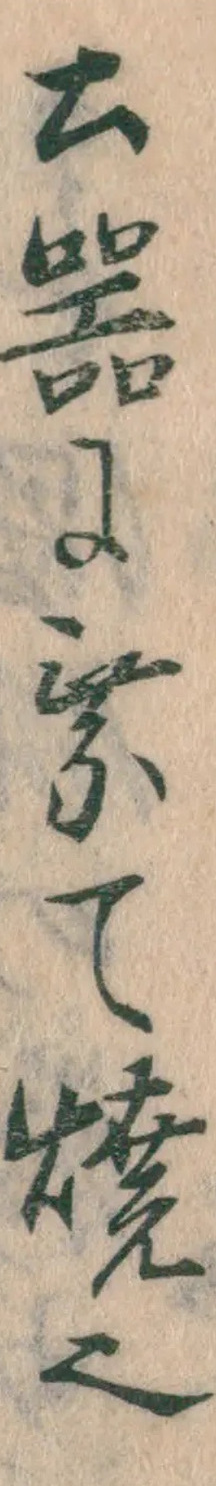土器に乗て焼也
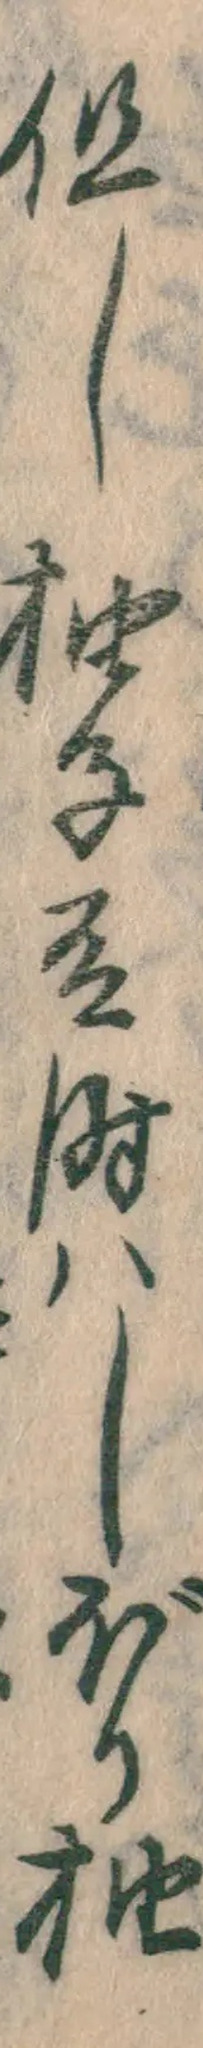但し柚子有時はしぼり柚
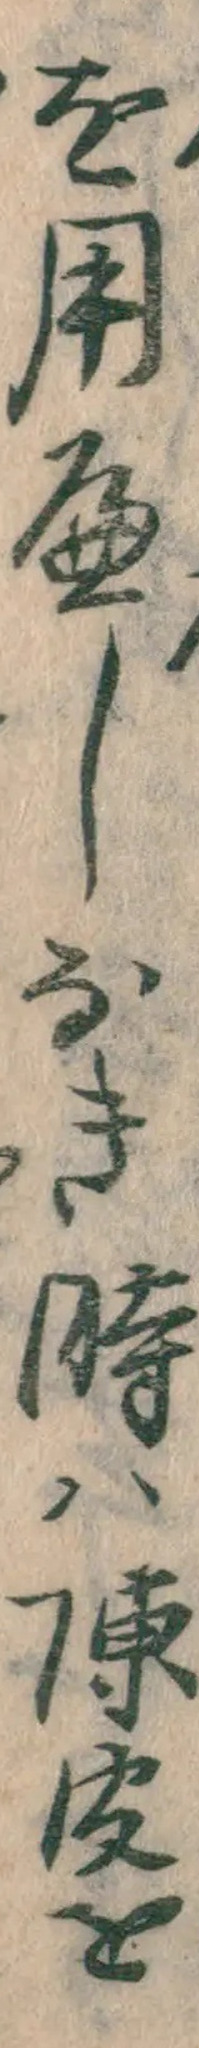を用へしなき時は陳皮を
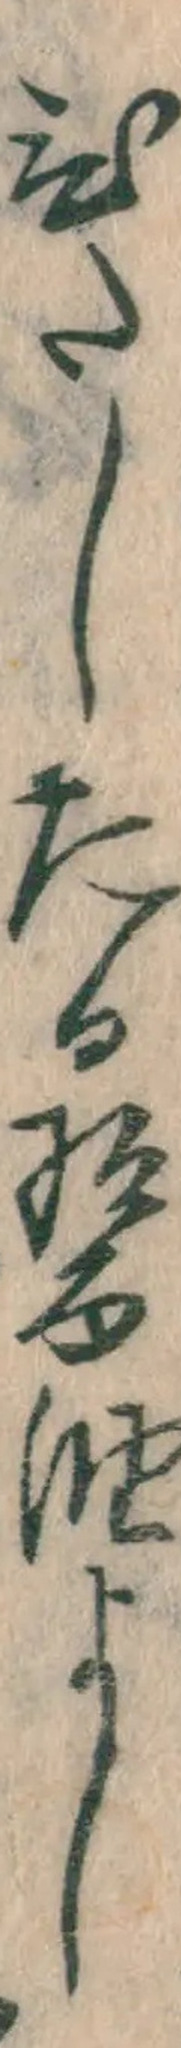ひたしたる醤油よし
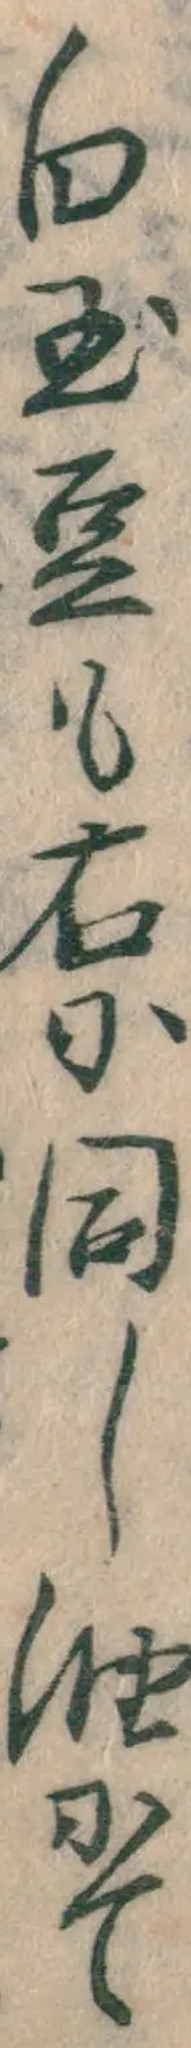白玉豆も右に同し油にて
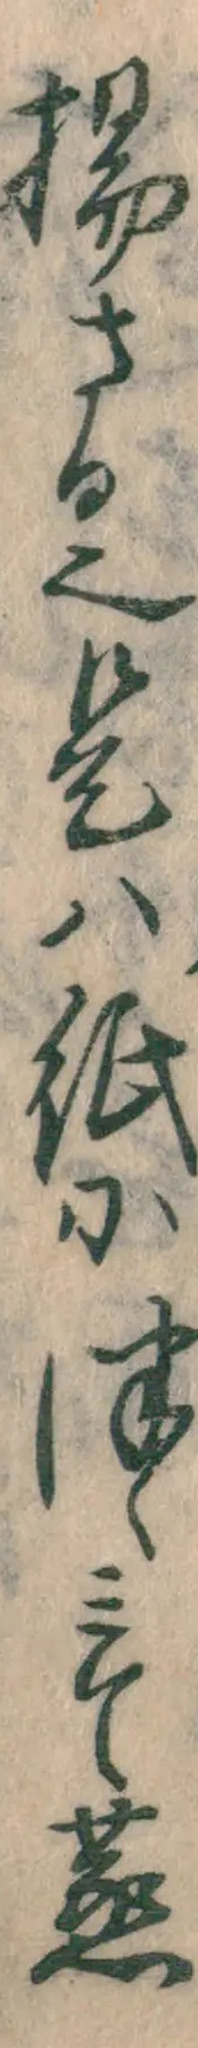揚さる也是は紙につゝみて蒸

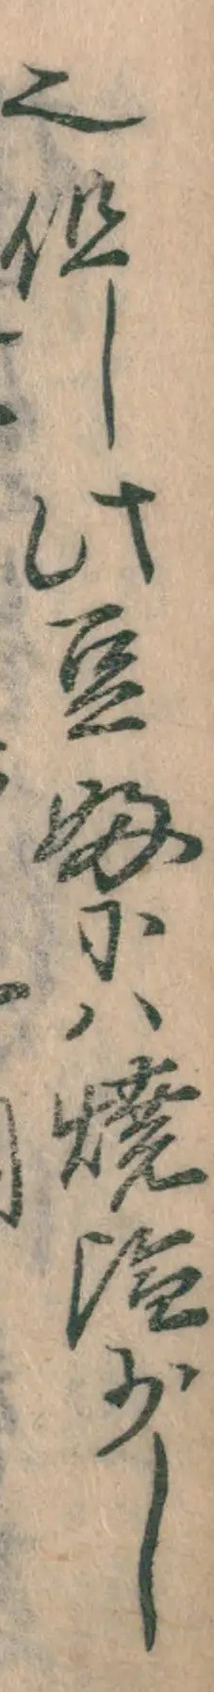也但し此豆ふには焼塩少し
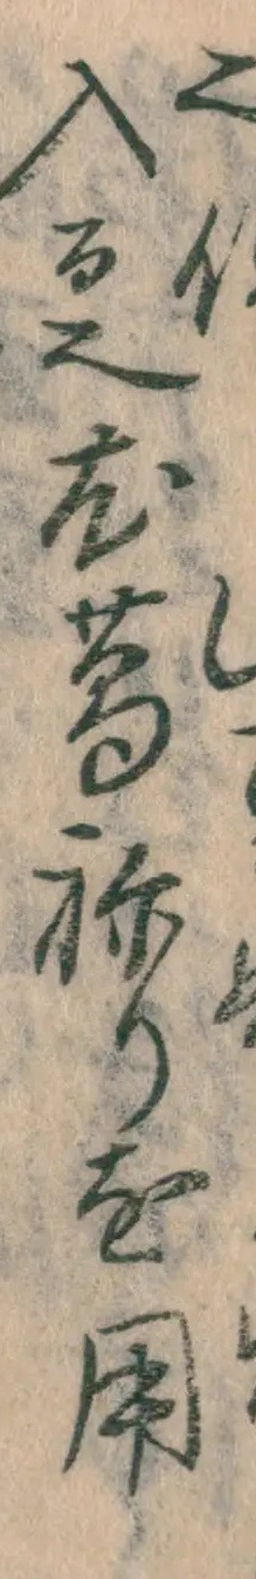入る也尤葛ねりを用
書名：豆腐百珍余録
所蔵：国立国会図書館 National Diet Library, JAPAN
